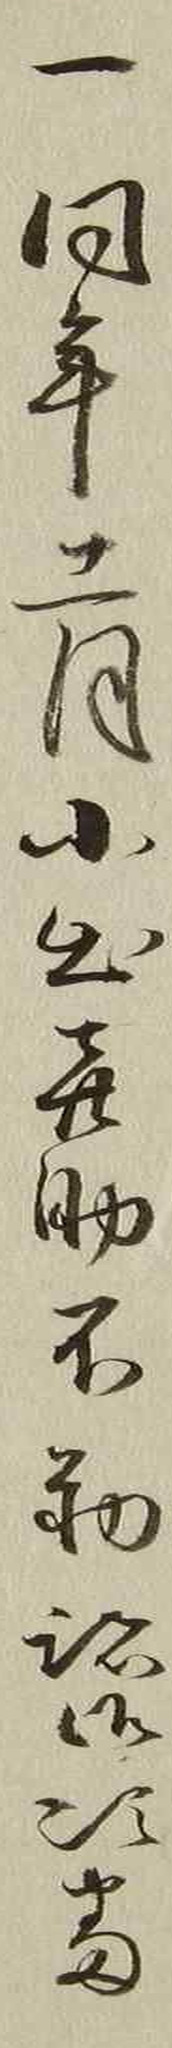一同年十一月小出喜助不勤跡御次番
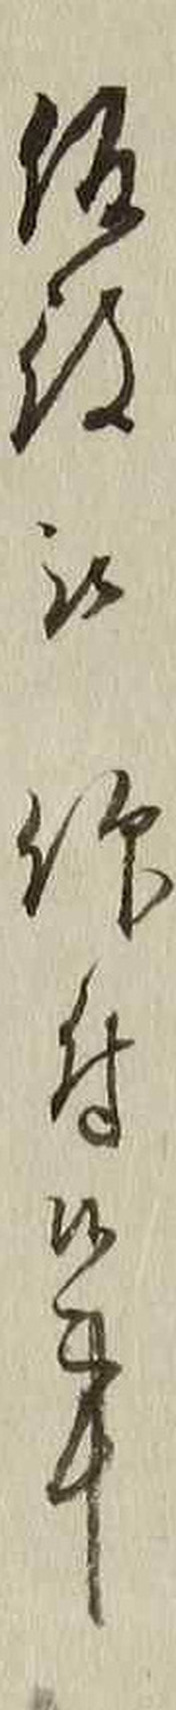仮役被仰付候事
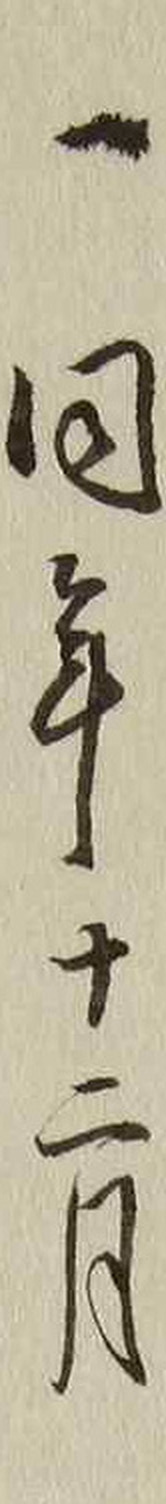一同年十二月
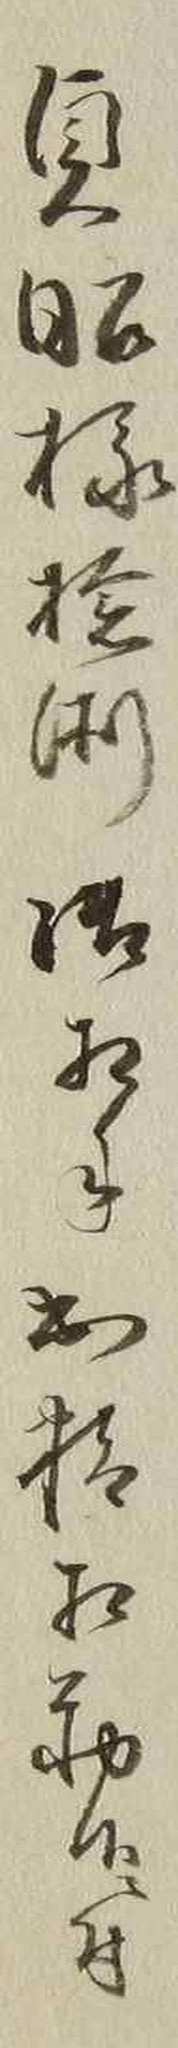貞昭様槍術御相手出精相勤候ニ付
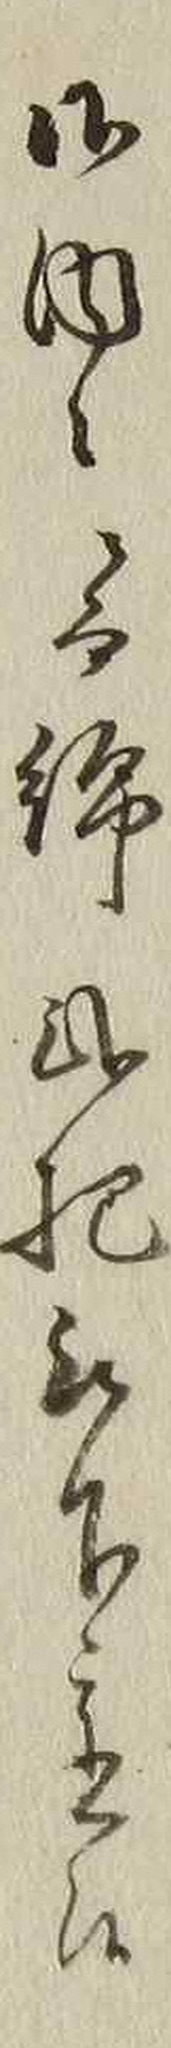御内々ニ而綿弐把被下置候
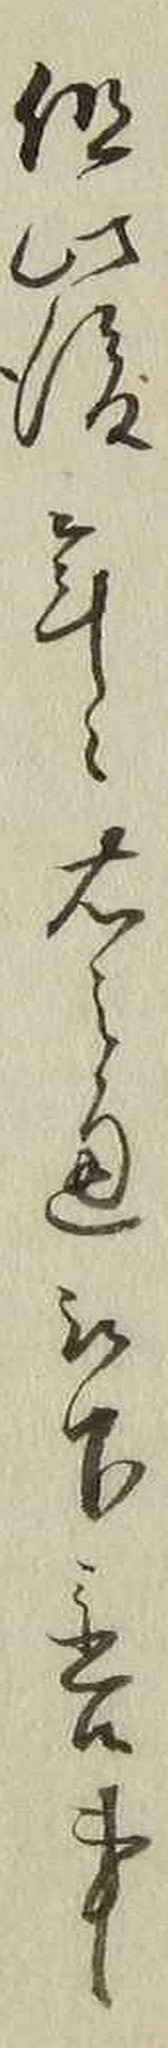但此後年々右之通被下置候事
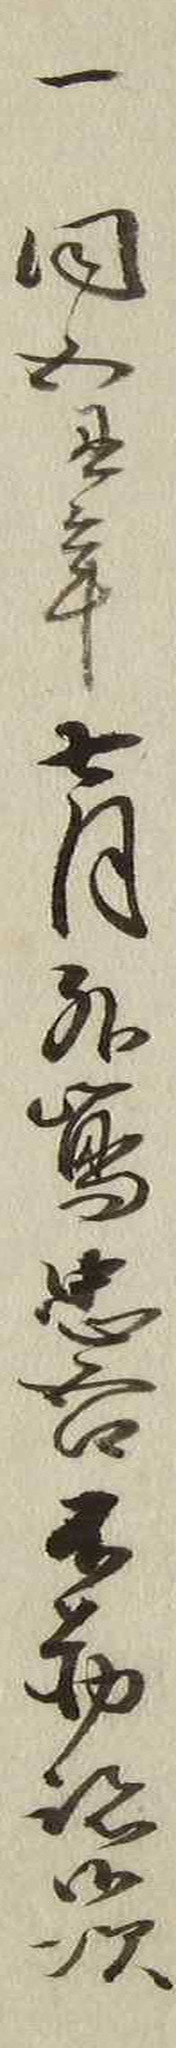一同五丑年七月外嶋忠吾不勤跡御次
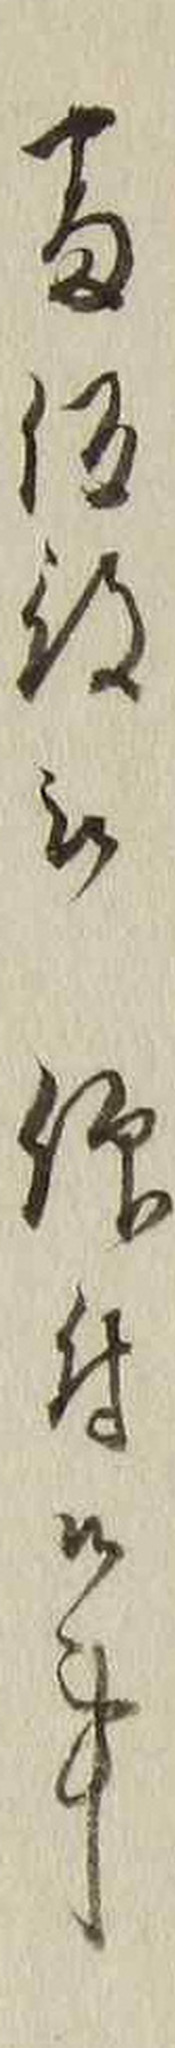番仮役被仰付候事
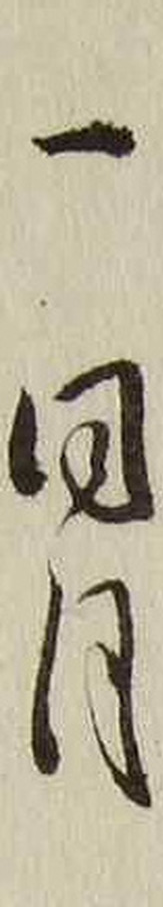一同月
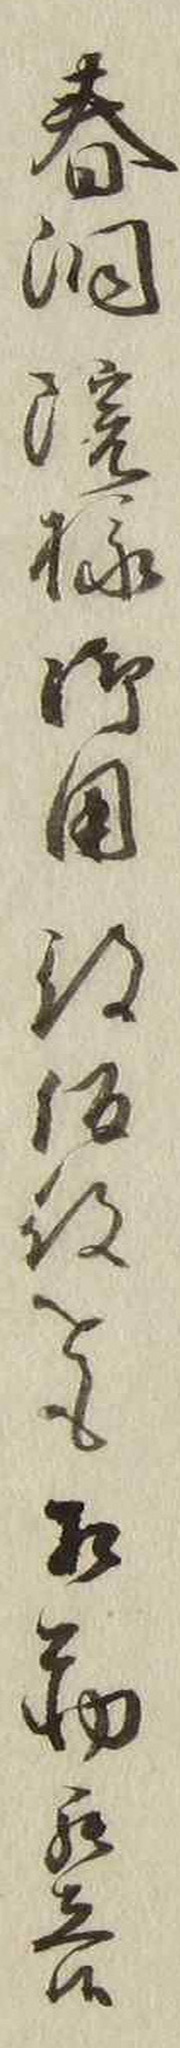春洞院様御用役仮役をも相勤罷在候
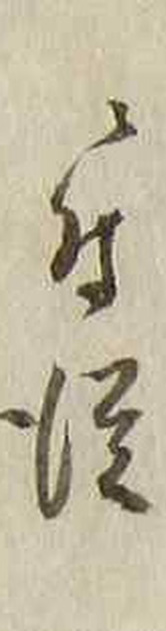ニ付従

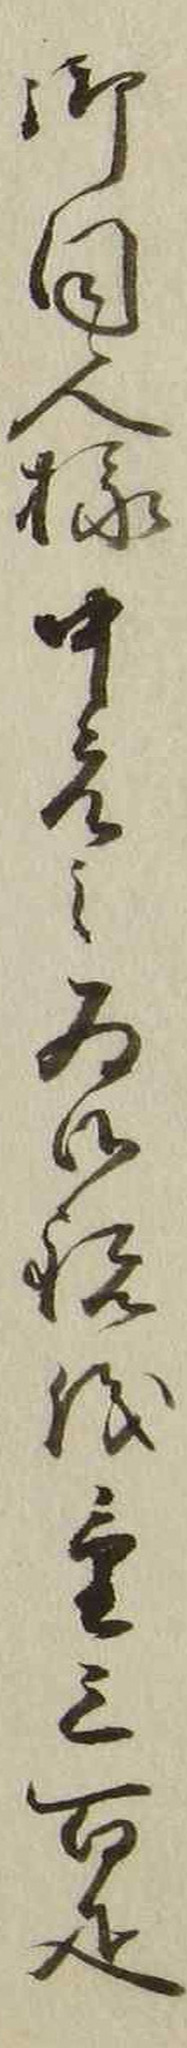御同人様中元之為御祝儀金三百疋
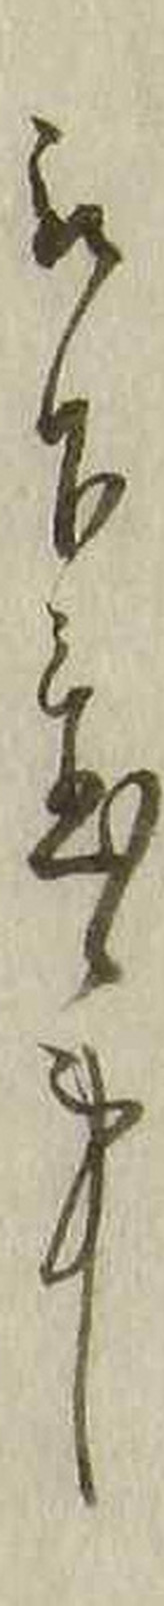被下置候事
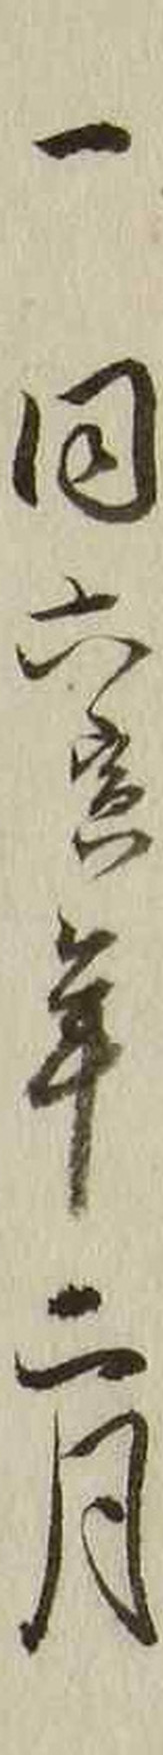一同六寅年二月
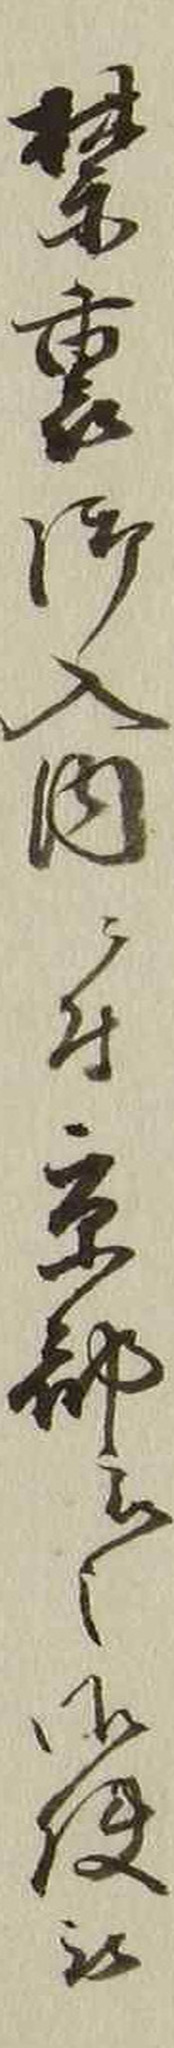禁裏御入内ニ付京都江之御使被
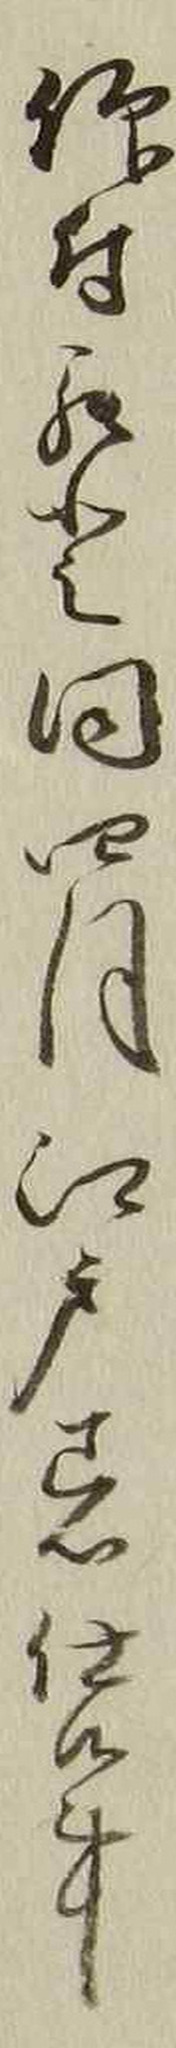仰付罷登同四月江戸着仕候事
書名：諸士系譜　巻之28　い之部28
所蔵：会津若松市立会津図書館
